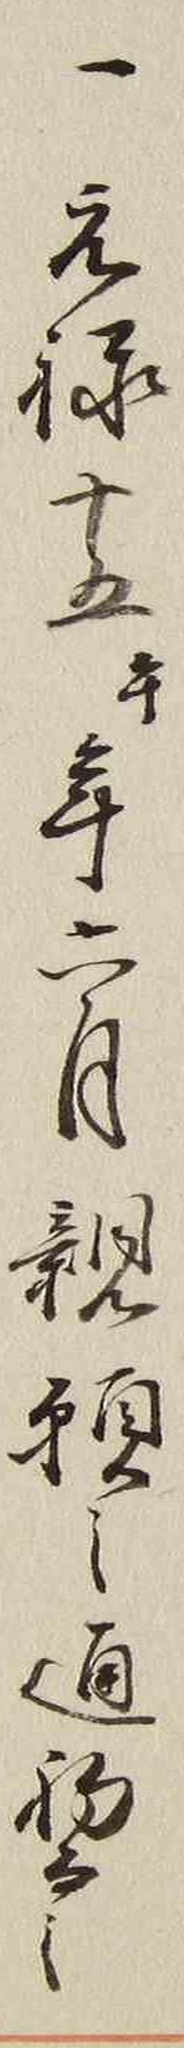一元禄十五午年六月親願之通初而之
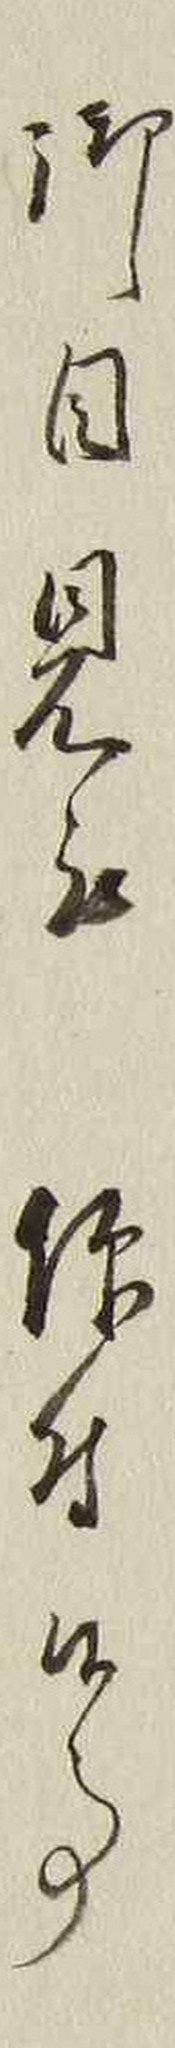御目見被仰付候事
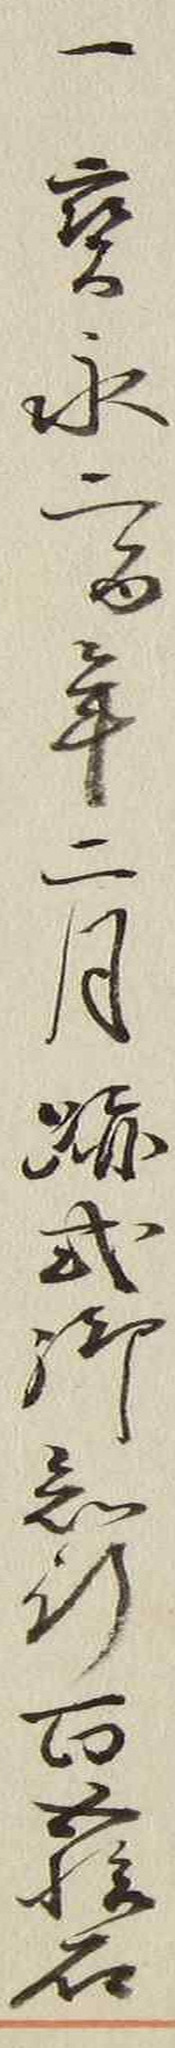一宝永二酉年二月跡式御知行百五拾石
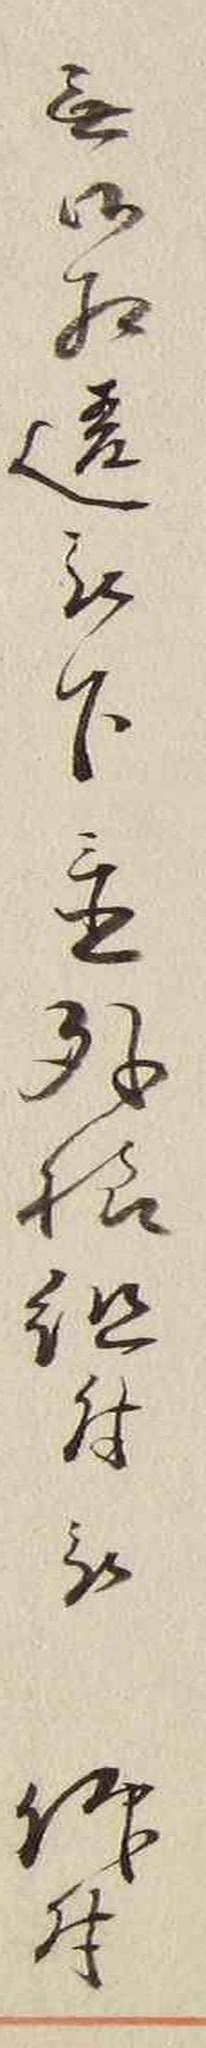無御相違被下置外様組付被仰付
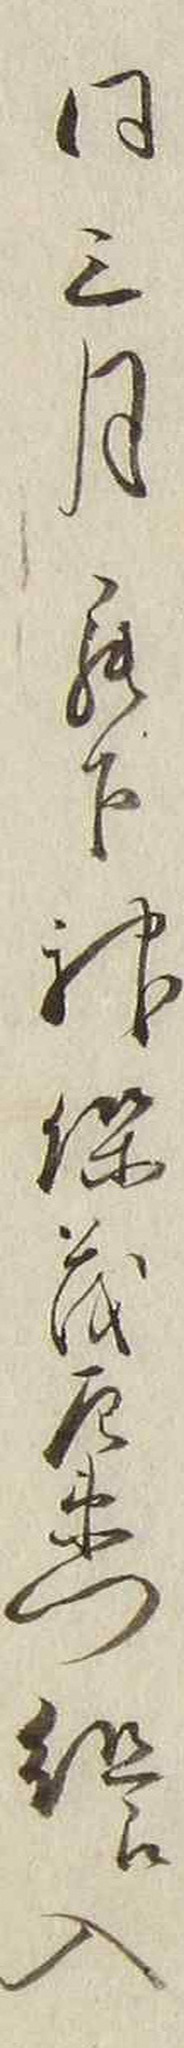同三月罷下神保茂左衛門組江入

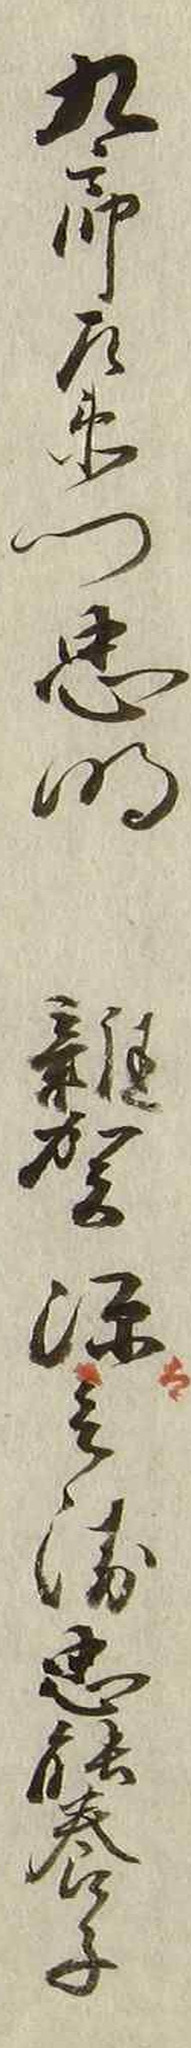九郎左衛門忠明雑賀源太兵衛忠能養子
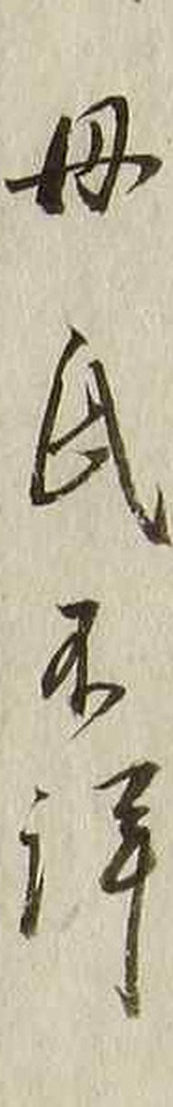母氏不詳
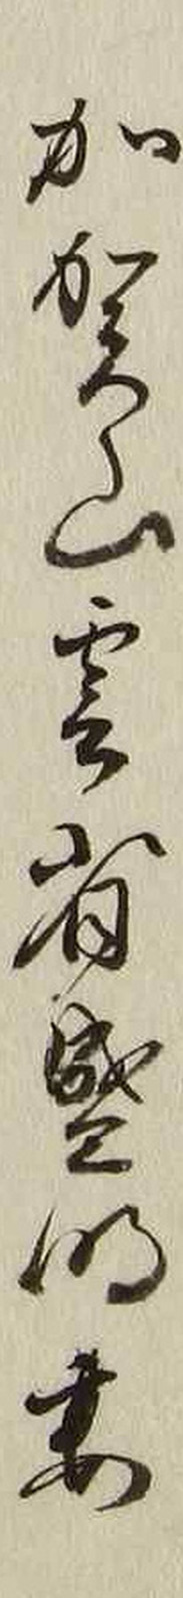女加賀山雲省盛明妻
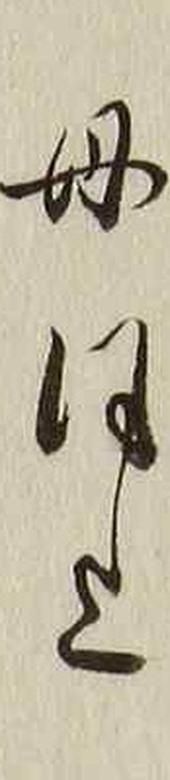母同上
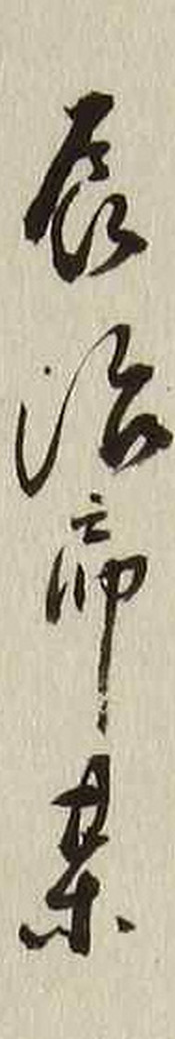辰治郎某
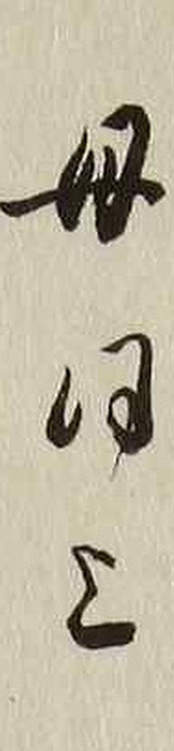母同上
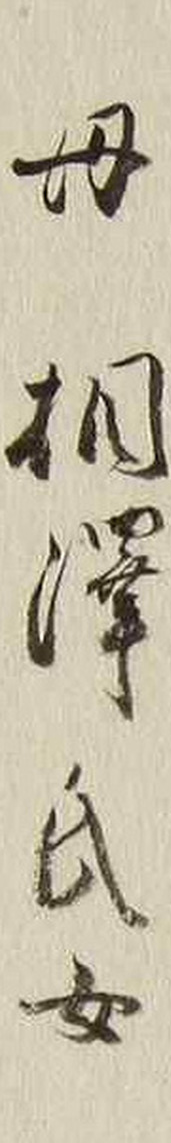母相沢氏女
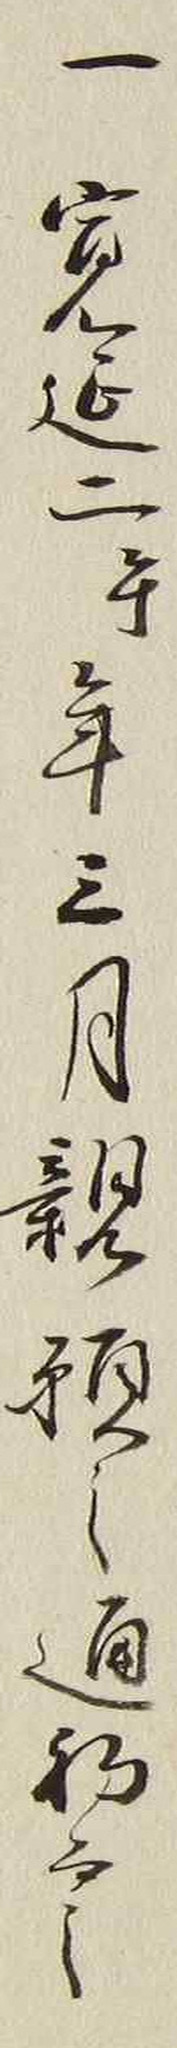一寛延二午年三月親願之通初而之
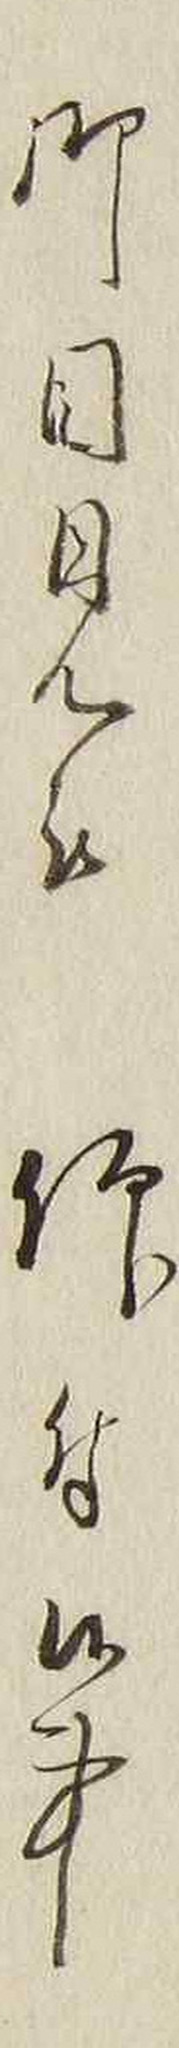御目見被仰付候事
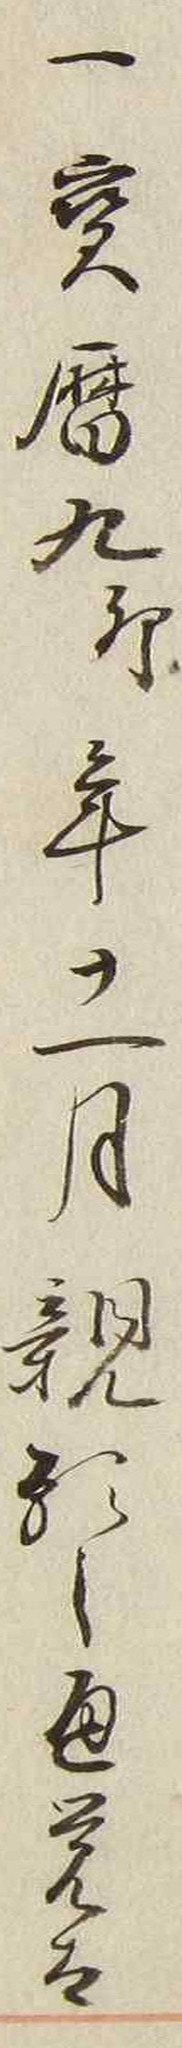一宝暦九卯年十一月親願之通覚太

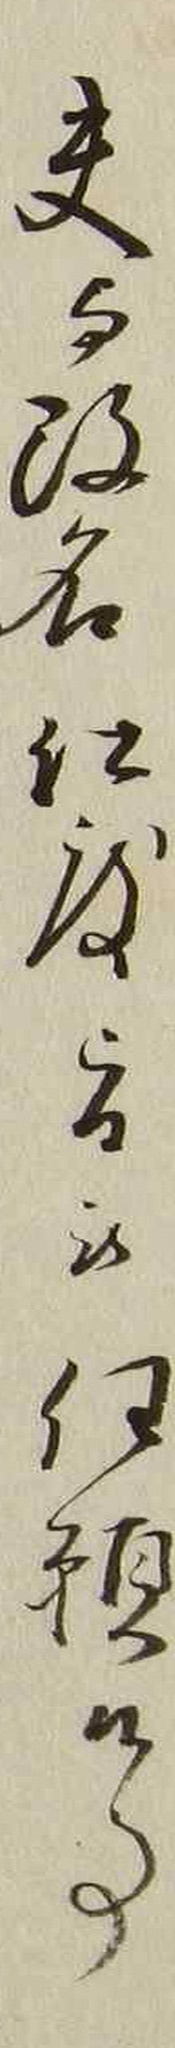夫与改名仕度旨被任願候事
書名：諸士系譜　巻之141　た之部17
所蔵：会津若松市立会津図書館
